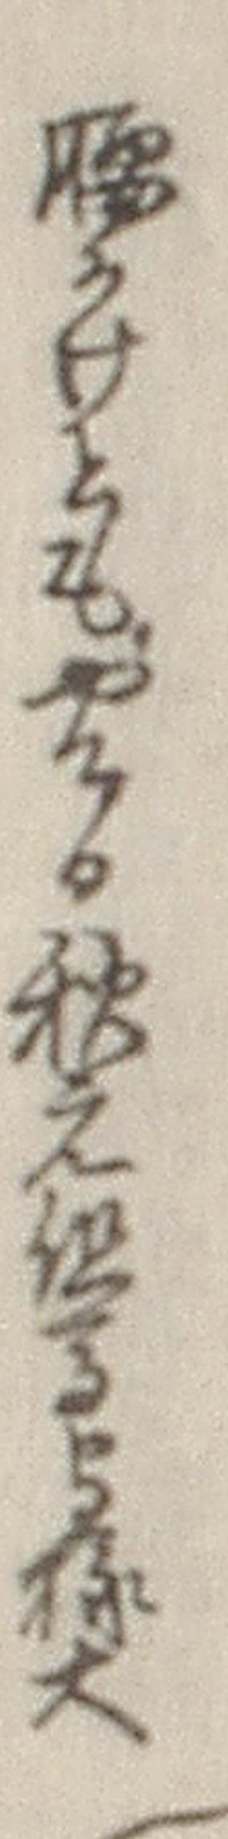腰かけともやける秋元但馬守様大
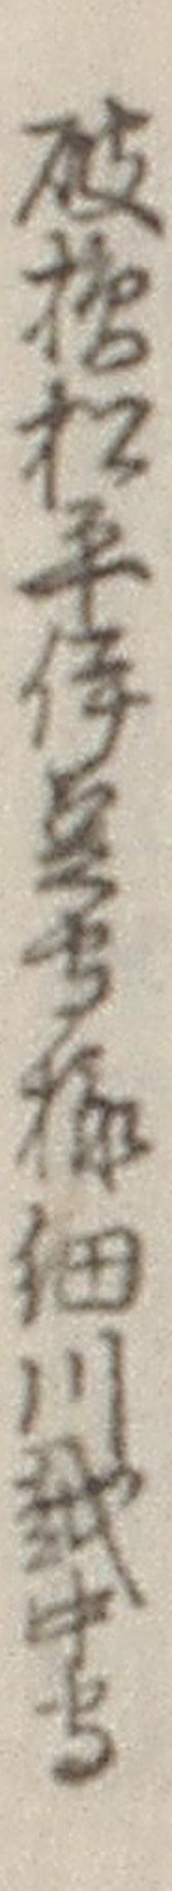破損松平伊豆守様細川越中守
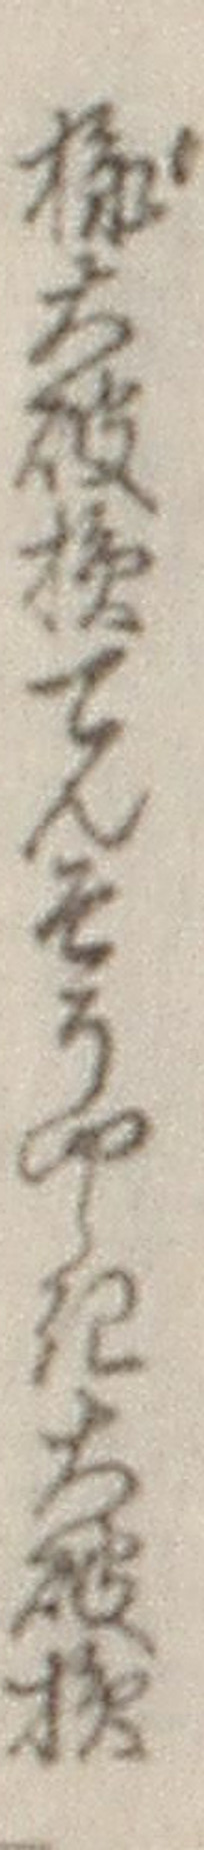様大破損てんそうやしき大破損
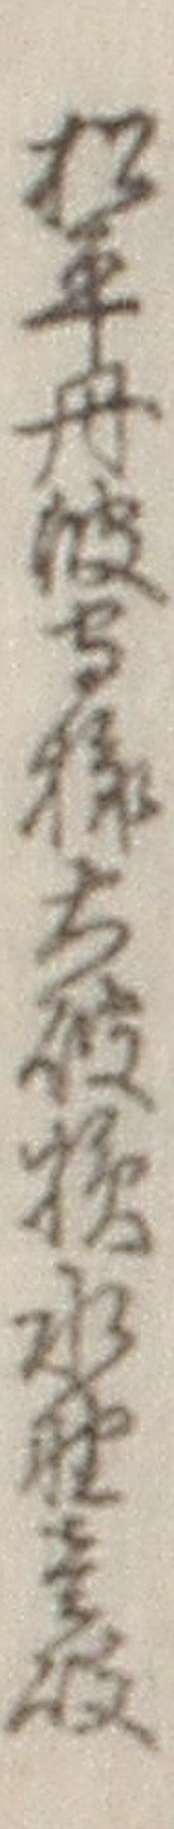松平丹波守様大破損水野壱岐
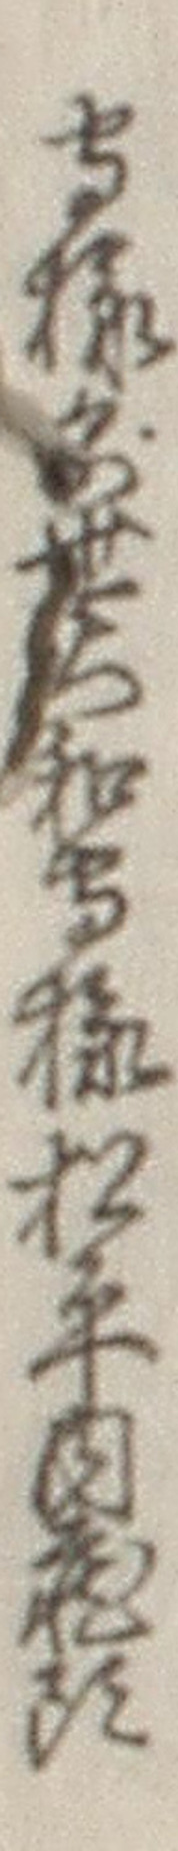守様久世大和守様松平内蔵頭
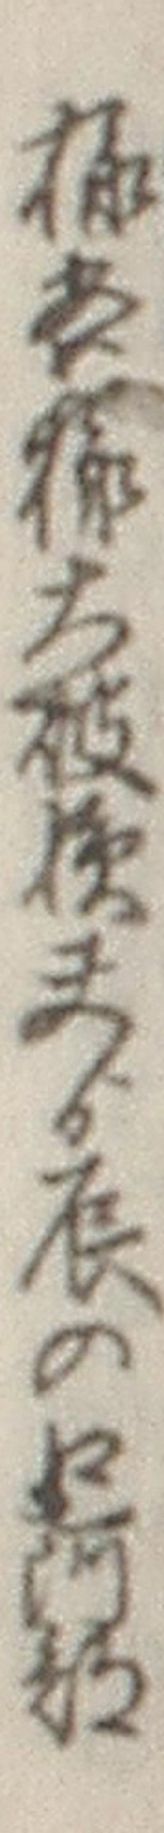様森様大破損夫ゟ辰の口阿部
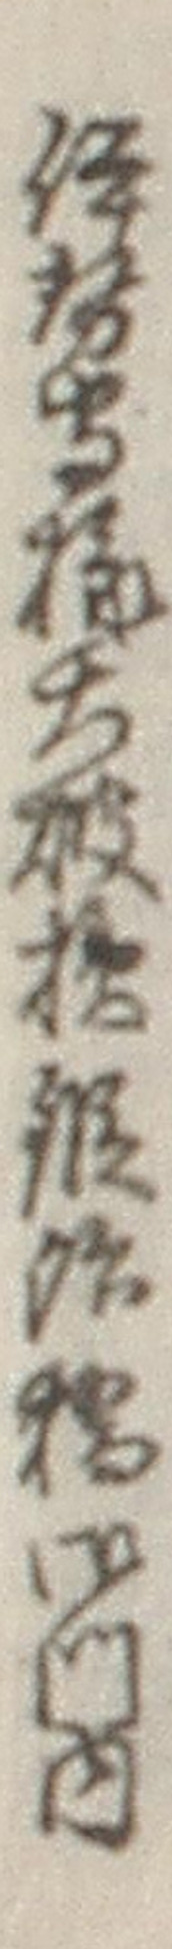伊勢守様大破損梶橋御門内
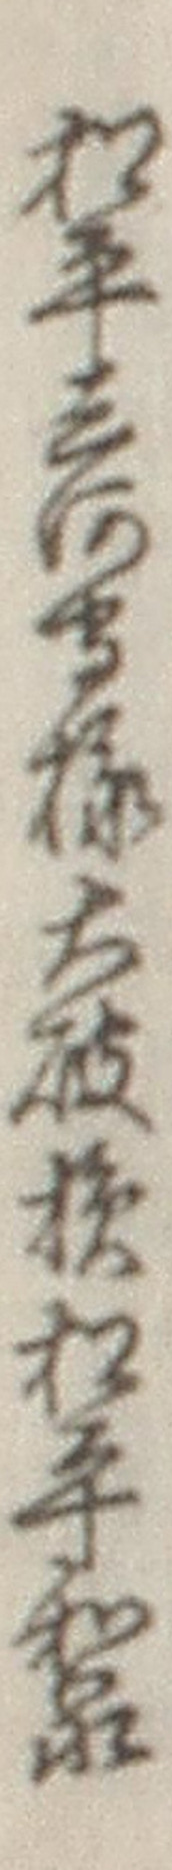松平三河守様大破損松平和泉
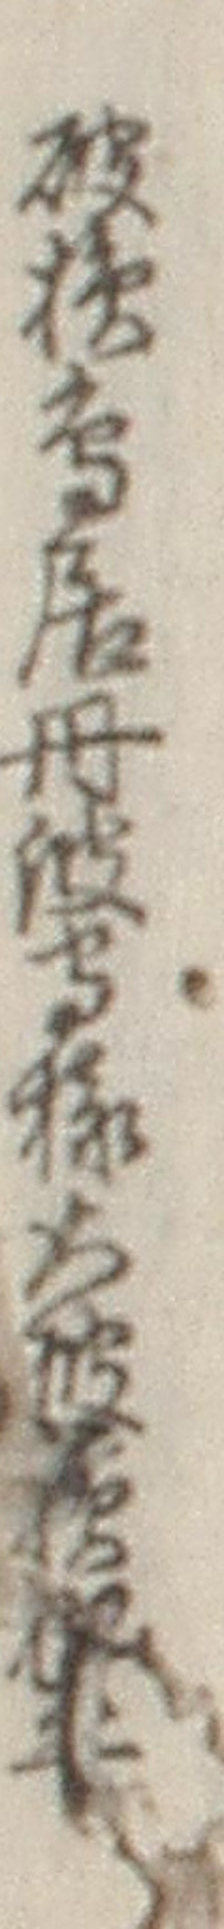破損鳥居丹波守様大破損松平
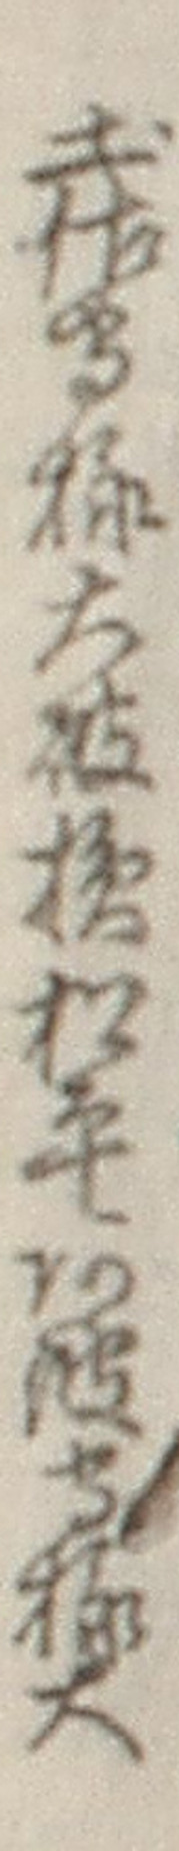土佐守様大破損松平阿波守様大
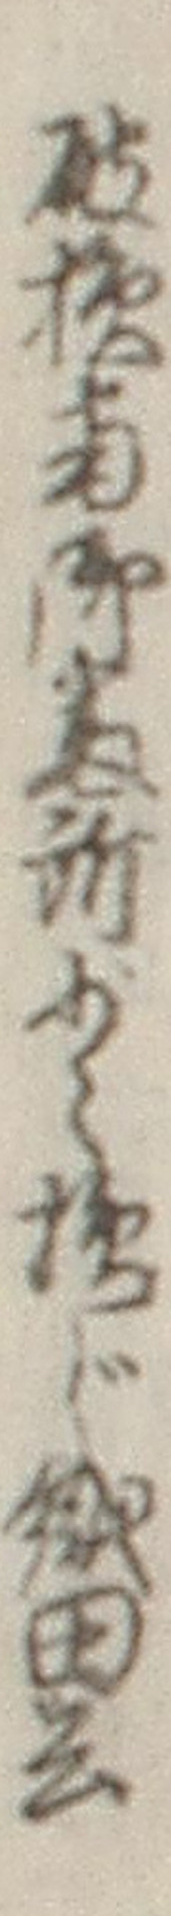破損南御番所少〻損じ織田兵
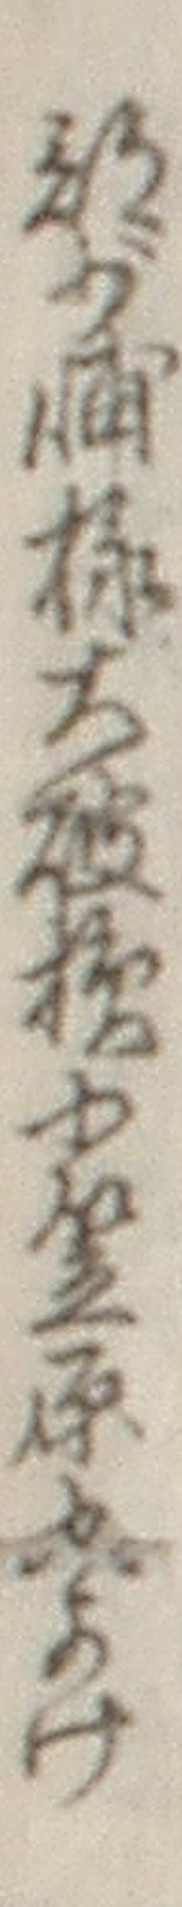部少輔様大破損小笠原よけ
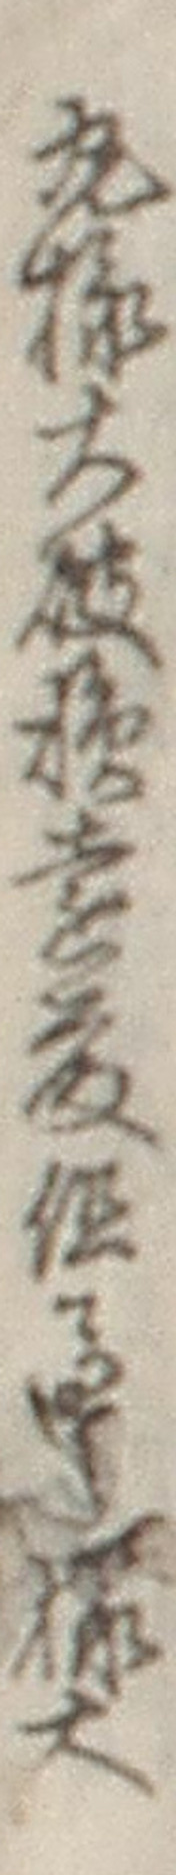丸様大破損遠藤但馬守様大
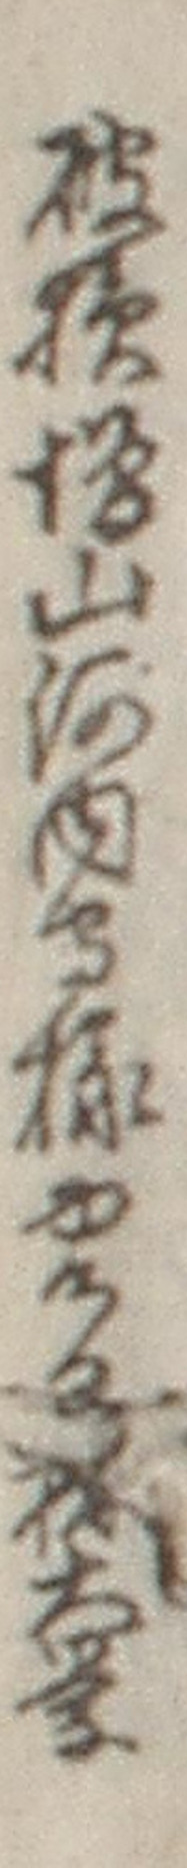破損増山河内守様やける林大学

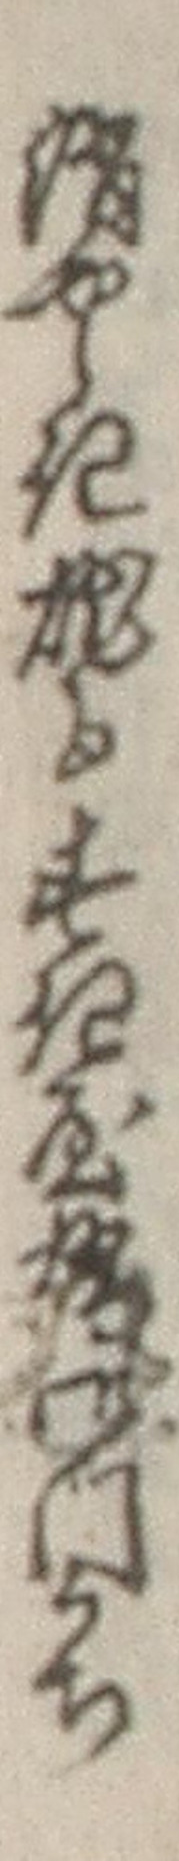消やしき焼るすき屋敷御門うち
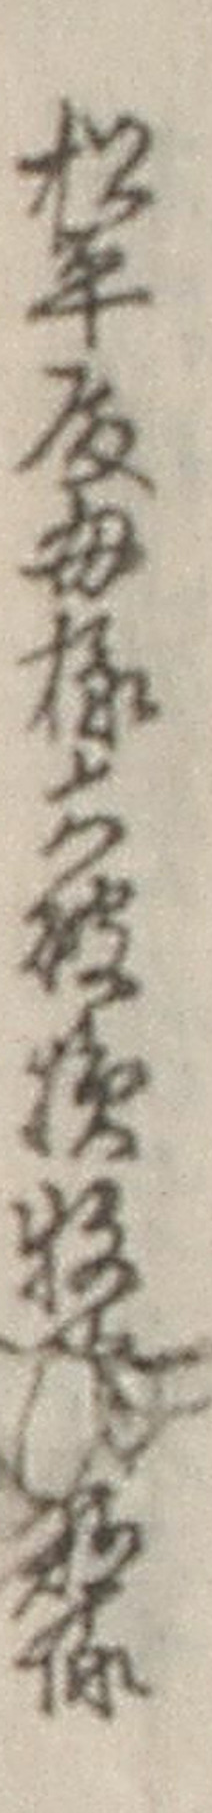松平殿母様大破損牧兵部様
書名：江戸　大地震臣細録　全
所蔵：東京大学地震研究所図書室 Earthquake Research Institute Library, The University of Tokyo, JAPAN
